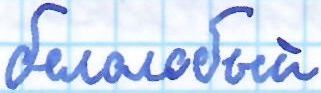белолобый
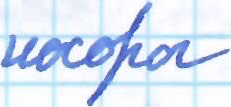носорог
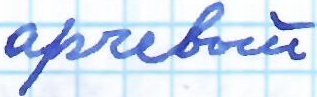арчевый
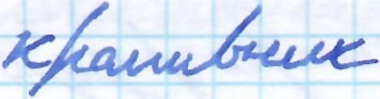крапивник
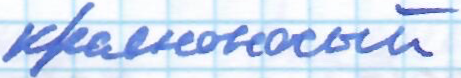красноносый
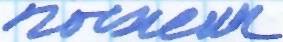пыжик
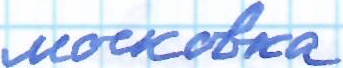московка
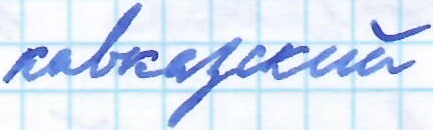кавказский
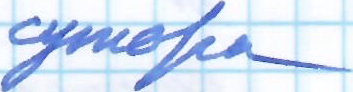сутора
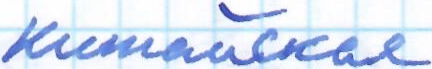китайская
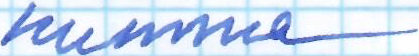питта
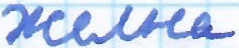желна
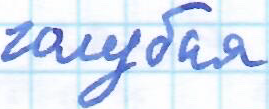голубая
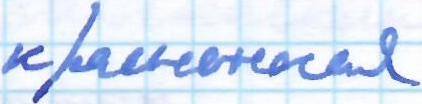красноногая
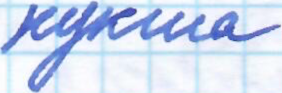кукша
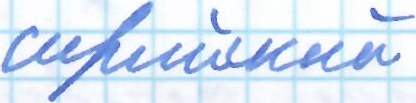сирийский
